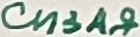сизая
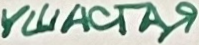ушастая
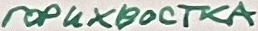горихвостка
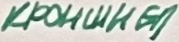кроншнеп
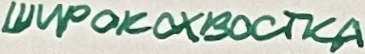широкохвостка
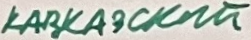кавказский
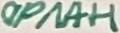орлан
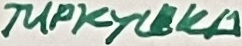тиркушка
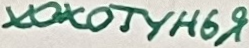хохотунья
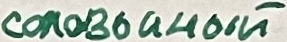соловьиный
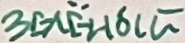зелёный
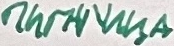пигалица
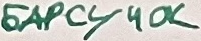барсучок
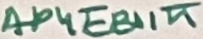арчевый
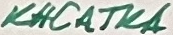касатка
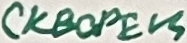скворец
